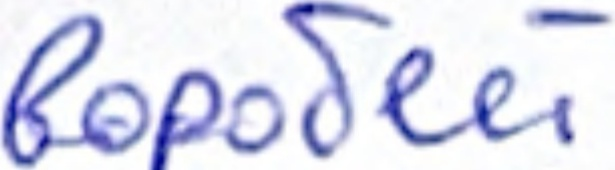воробей
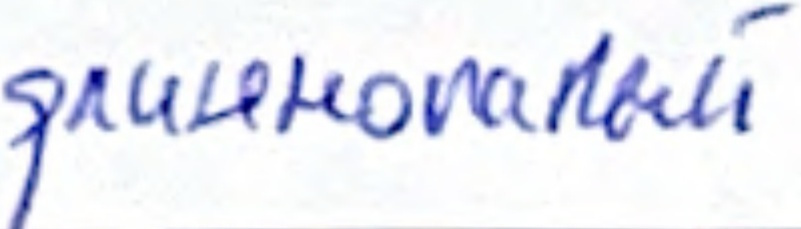длиннопалый
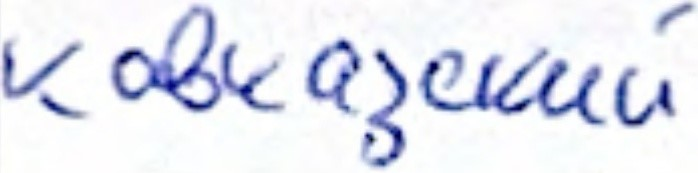кавказский
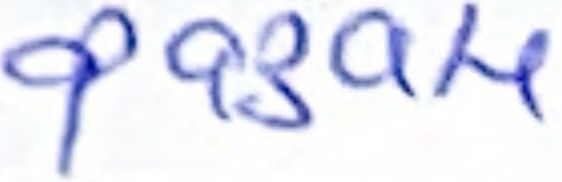фазан
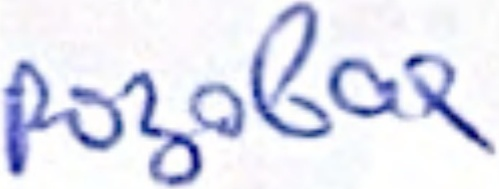розовая
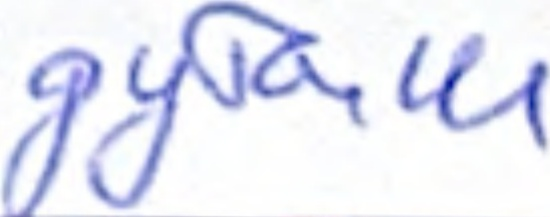дутыш
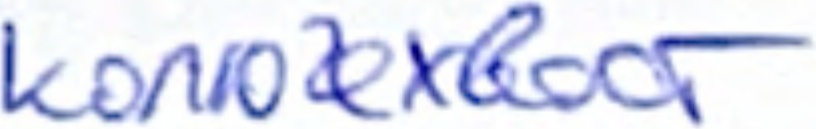колючехвост
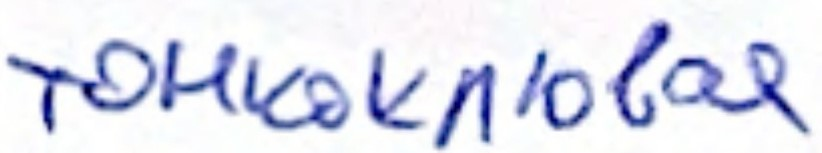тонкоклювая
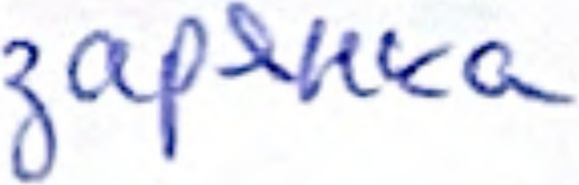зарянка
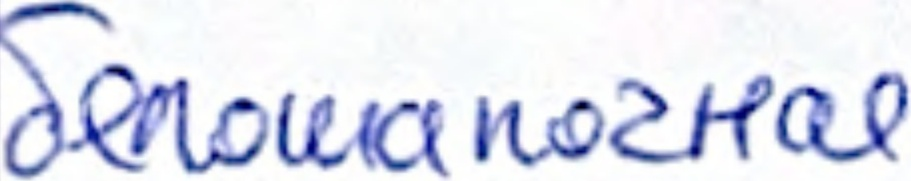белошапочная
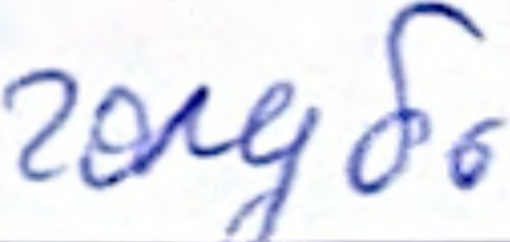голубь
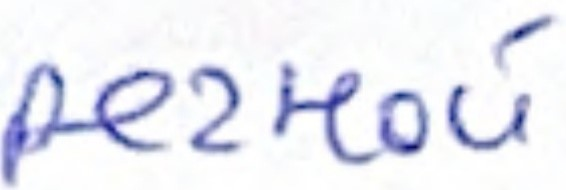речной
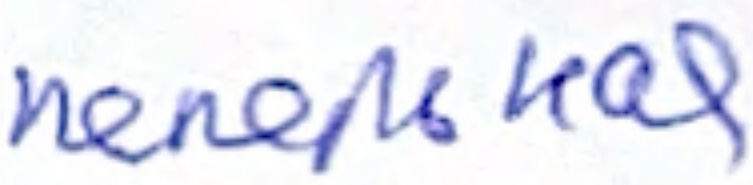пепельная
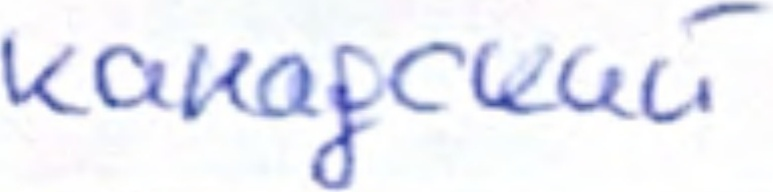канадский
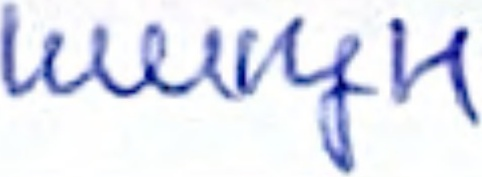шипун
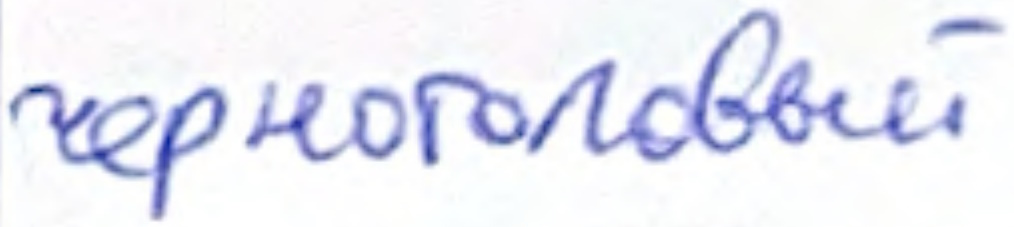черноголовый
